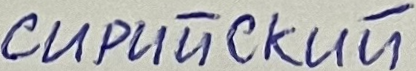сирийский
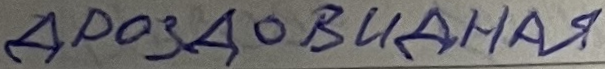дроздовидная
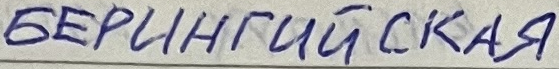берингийская
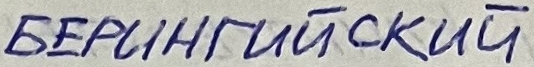берингийский
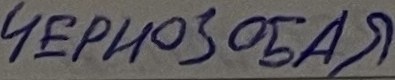чернозобая
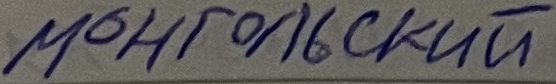монгольский
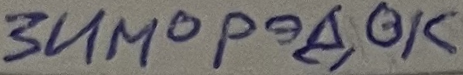зимородок
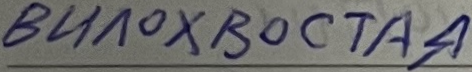вилохвостая
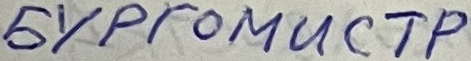бургомистр
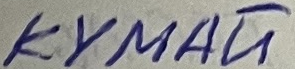кумай
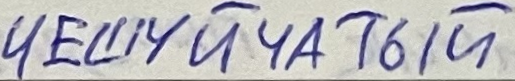чешуйчатый
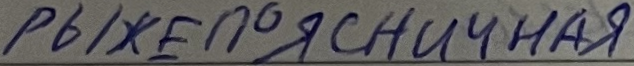рыжепоясничная
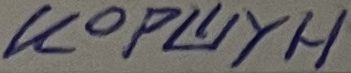коршун
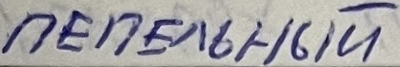пепельный
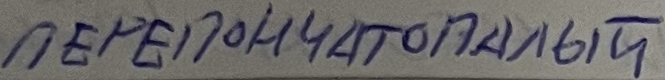перепончатопалый
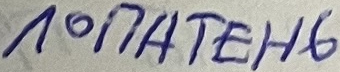лопатень
